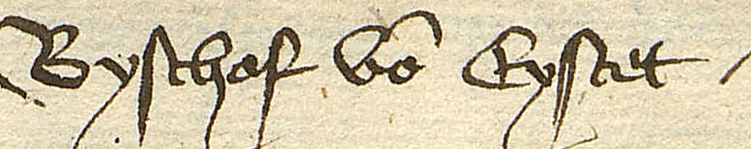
Byſchof vo* Eyſtet /
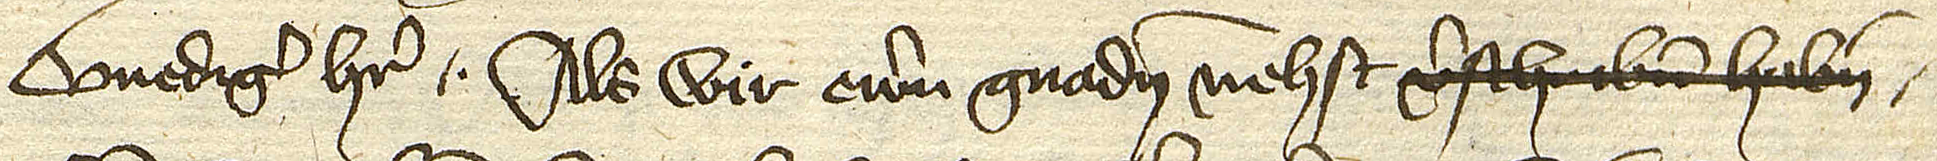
Gnedig* hr* / . Als wir ewn* gnadn* nehſt v*ſchribn* habn* /
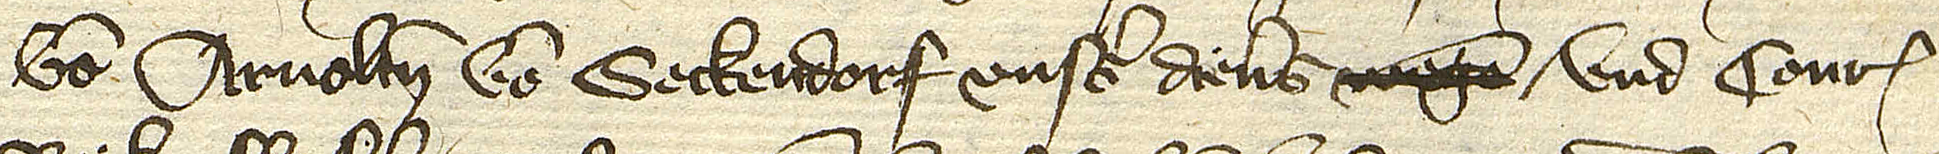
vo* Arnoltn* vo* Seckendorf vnſ*s dien*s wege* / vnd Conr*
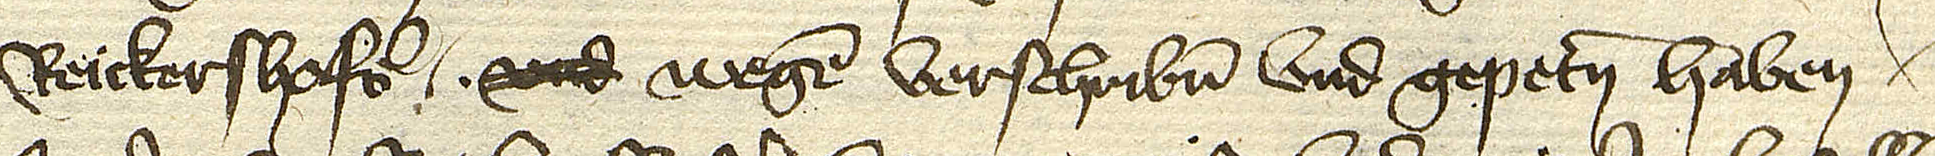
Reickerſhofs* / . vnd wege* verſchribn* vnd gepetn* haben /
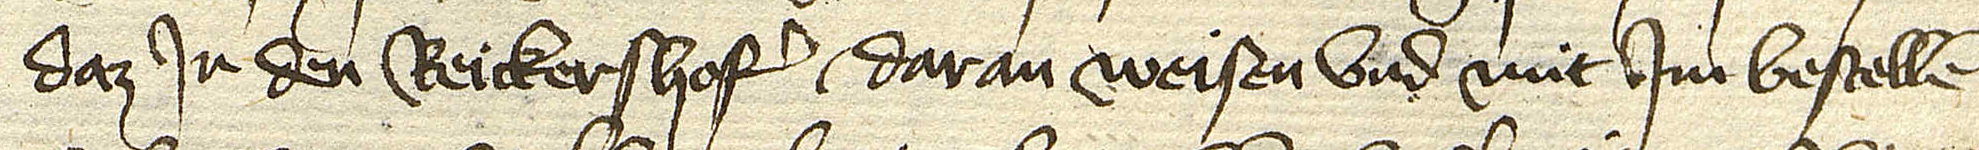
daʒ Ir den Reickerſhof* / daran weiſen vnd mit Im beſtelle*
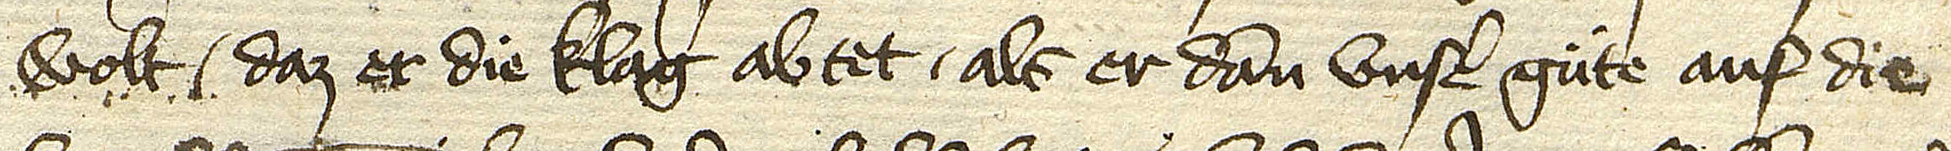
wolt / daʒ er die klag abtet / als er da*n vnſe* güte auf die
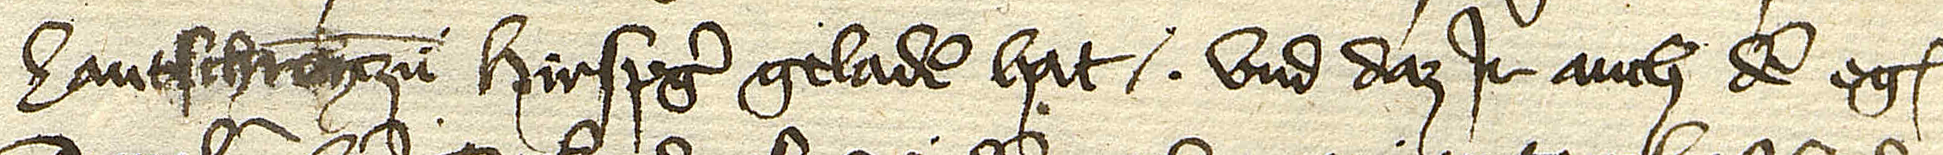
Lantſchran* cʒü hirſpg* gelade* hat / . vnd daʒ Ir auch d* eg*
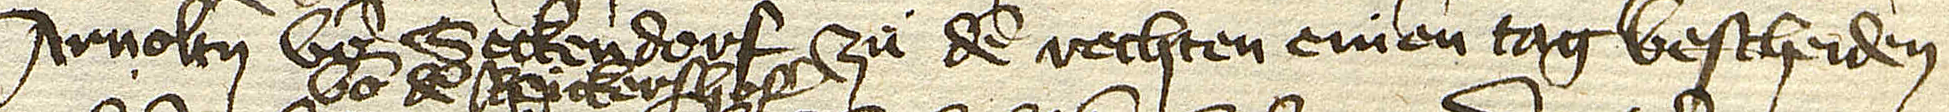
Arnoltn* vo* Seckendorf cʒü d* rechten einen tag beſcheiden
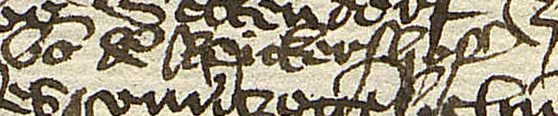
vo* d* Reickerſhof*
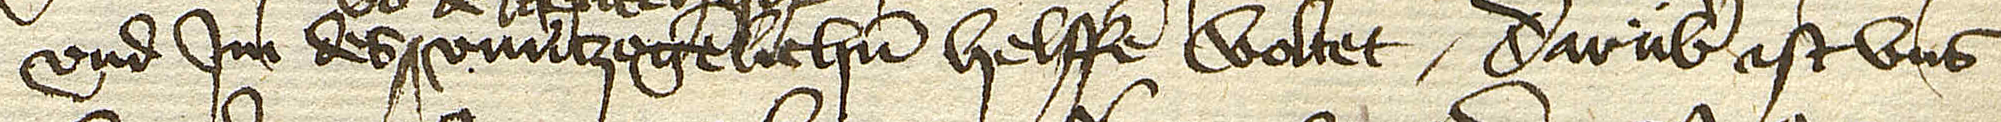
vnd Im des vnu*cʒoge*lichn* helffe* woltet / Darüb* iſt vns
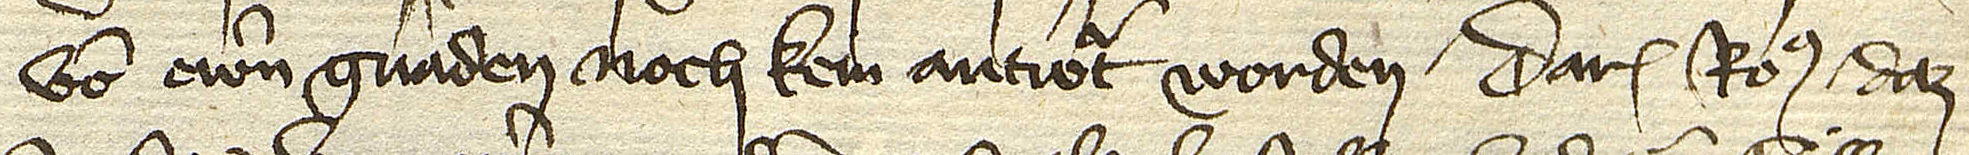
vo* ewn* gnaden noch kein antw*t worden / Dar* Ro* / daʒ
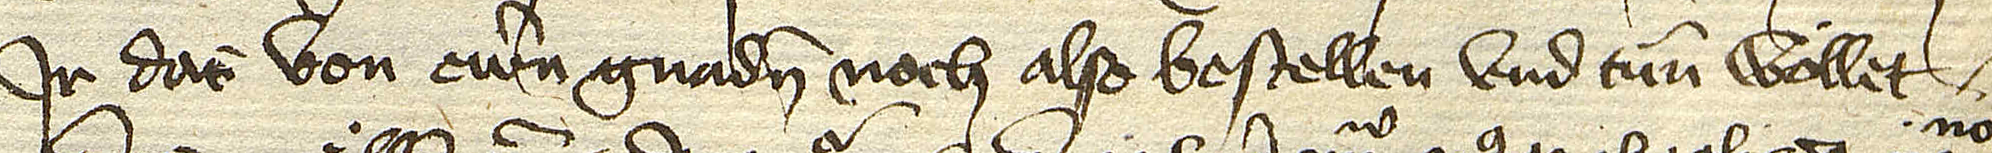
Ir das von ewn* gnadn* noch alſo beſtellen vnd tün wöllet /
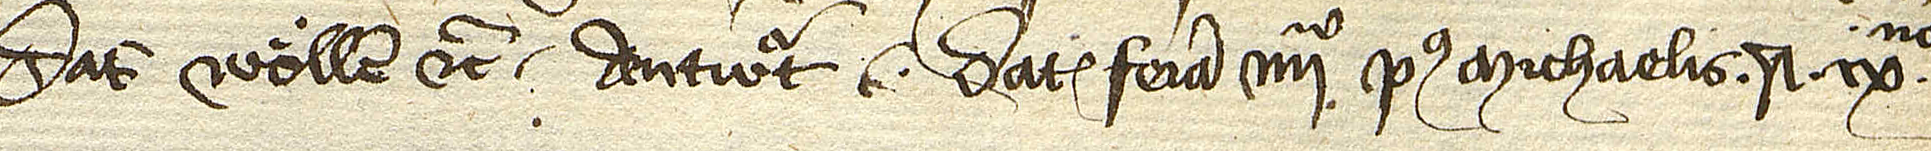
Das wölle* ec* / Antw*t / . Dat* feia* iiii* p* Michaelis . A. ix* .
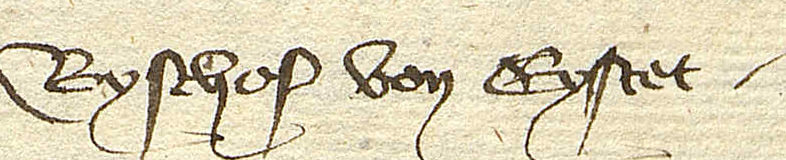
Byſchof von Eyſtet /
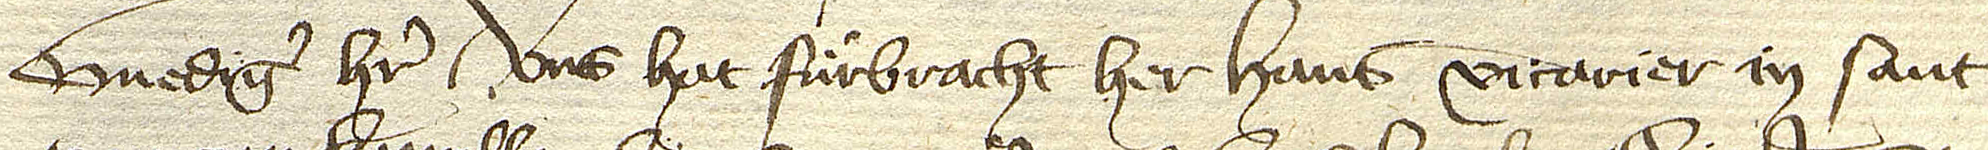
Gnedig* hr* / Vns hat fürbracht her hans vicarier in ſant
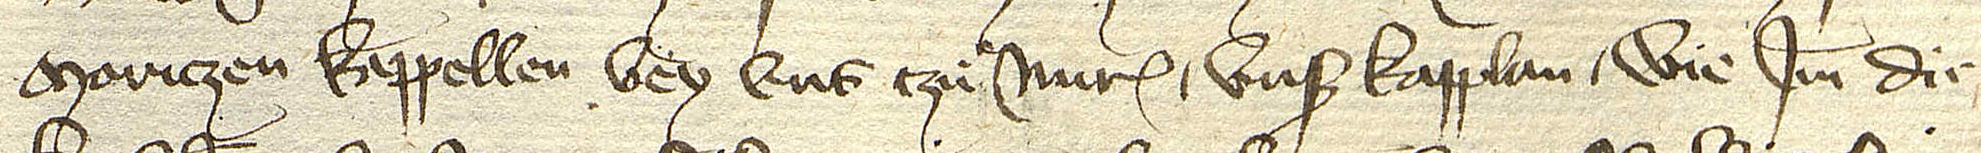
Moricʒen kappellen bey vns cʒü Nur* / vnſ* kapplan / wie Im die
